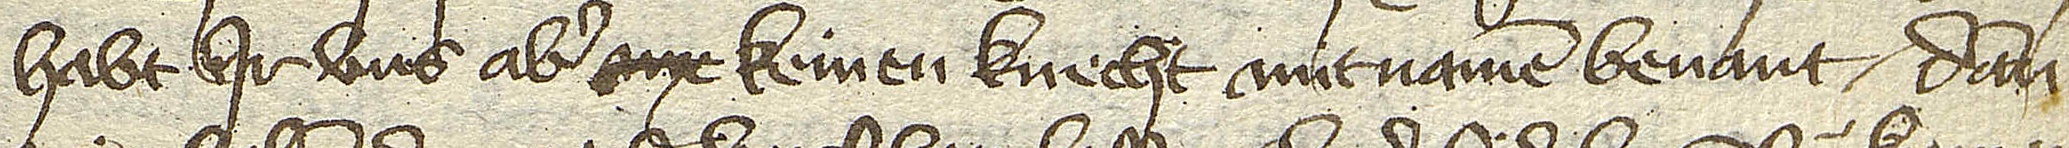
habt Ir vns ab* nye keinen knecht mitname* benant / dan*
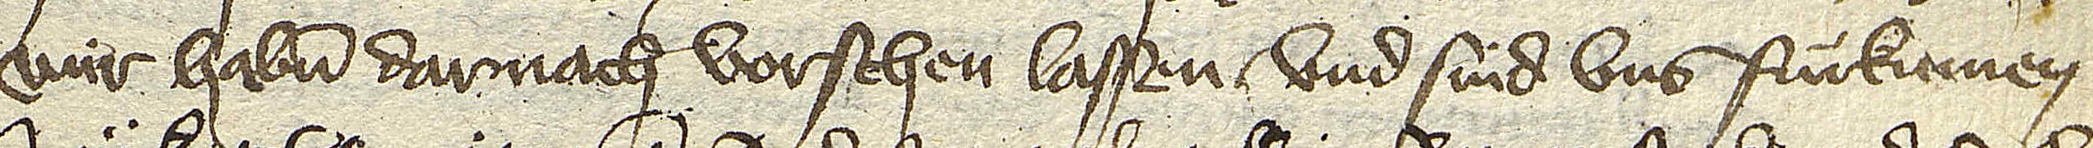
wir habn* darnach vorſchen laſſen / vnd ſind vns fürkumen
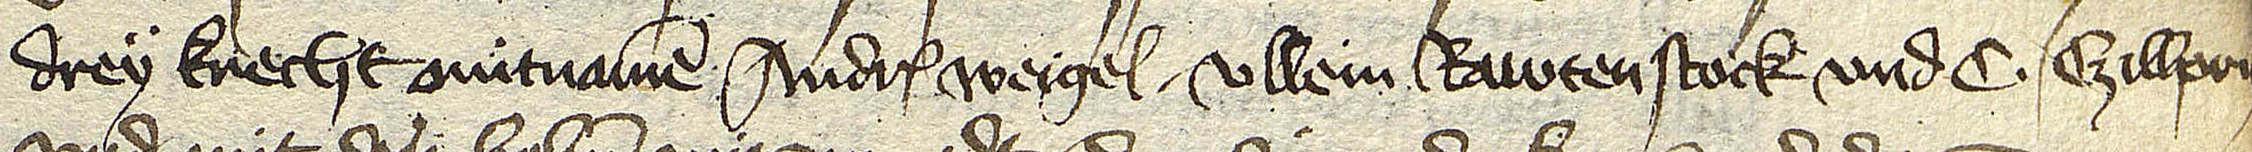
drey knecht mitname* Andr* weigel / vllein Rawtenſtock vnd C . Cʒilhorn
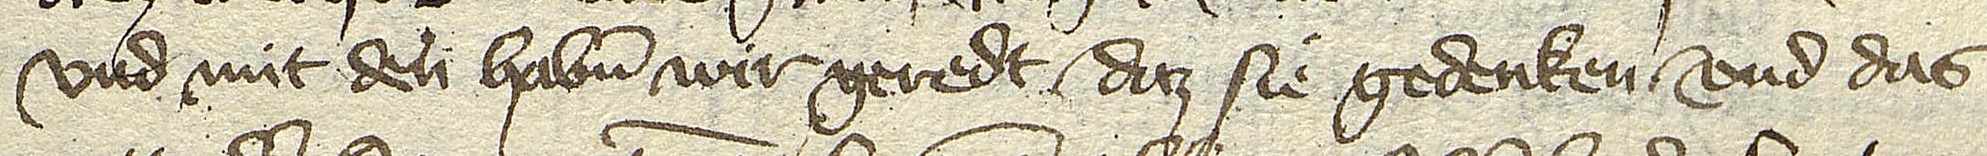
vnd mit den habn* wir geredt / daʒ ſie gedenken / vnd das
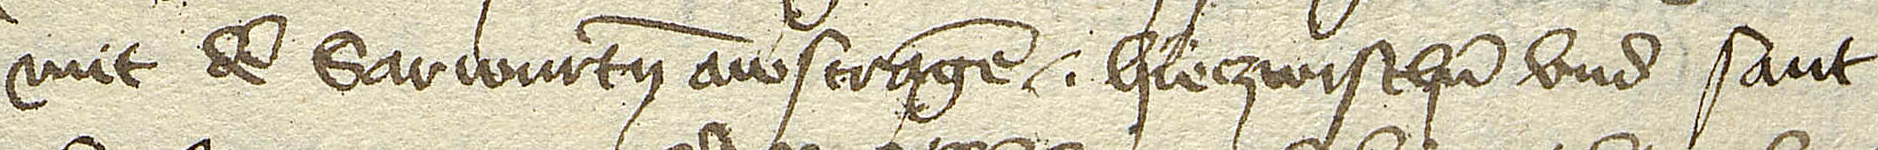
mit d* Sarwurtn* awſtrage* / . hiecʒwiſchn* vnd ſant
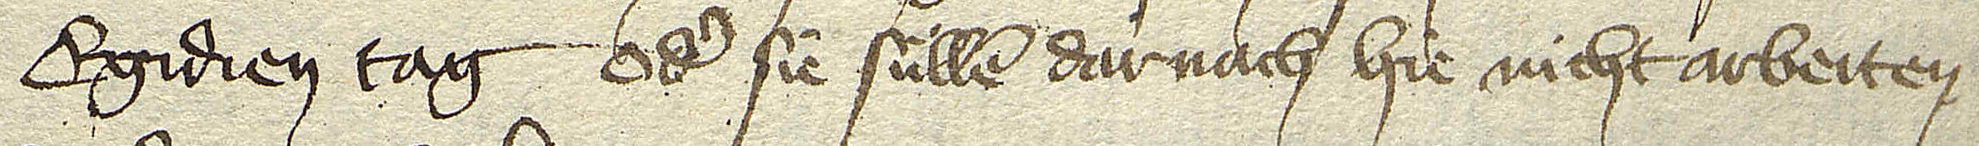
Egidien tag od* ſie ſülle* darnach hie nicht arbeiten
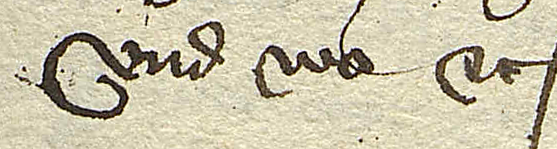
vnd wo ec*
